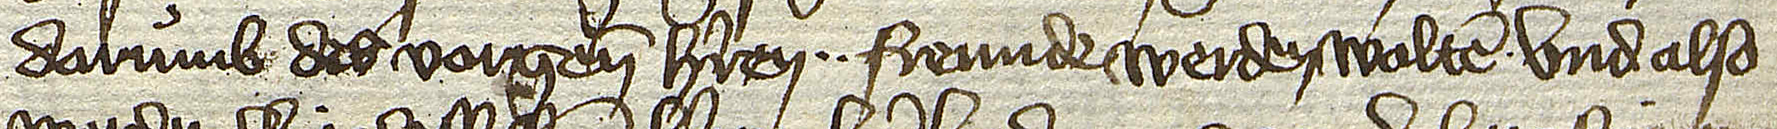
darümb des vorgen* h*ren ~ freunde werden wolte* . Vnd alſo
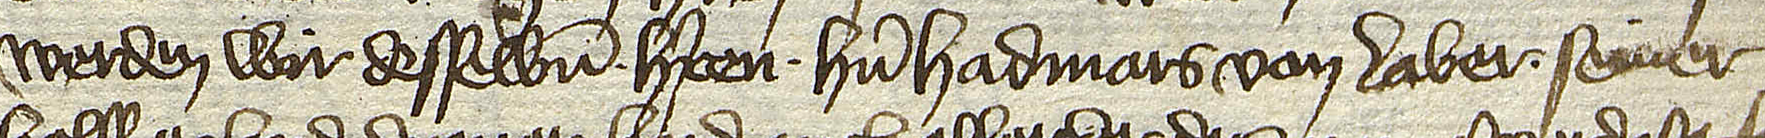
weden wir deſſelben . h*ren . h*n Hadmars von Laber . ſeiner .
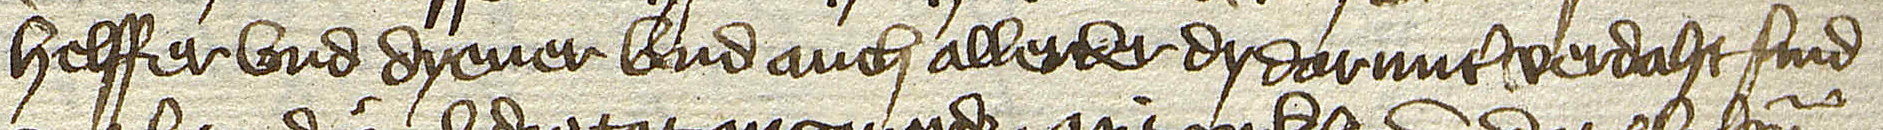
helffer vnd dyener vnd auch aller der dy darunt* verdaht ſind
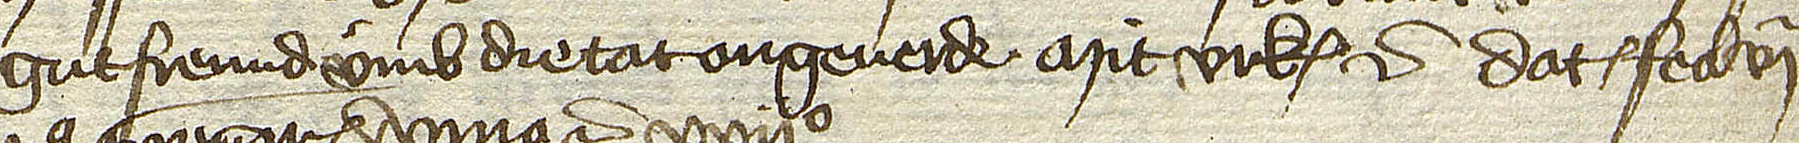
gut freund v̈mb die tat ongeuerde . Mit vrk* ec* dat* / fea* vi*
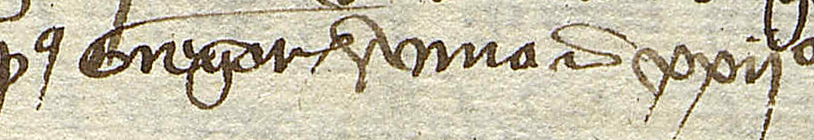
p* Gregor* Anna ec* xxii*
